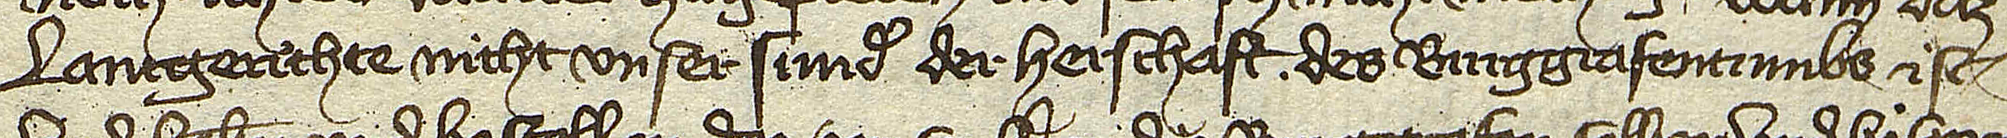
Lantgerichte nicht vnſer ſund* der herſchaft des Burggrafentumbs iſt /
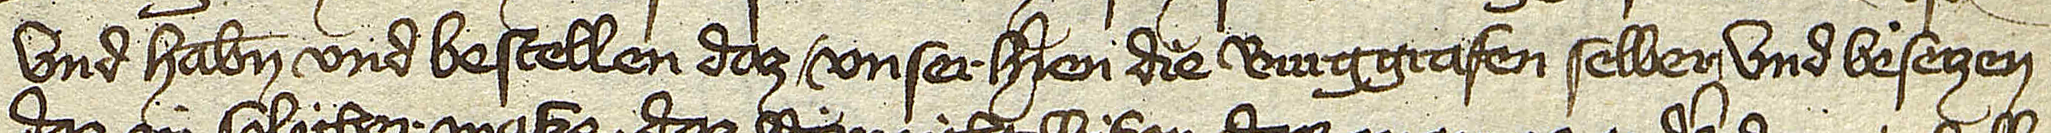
vnd habn* vnd beſtellen daʒ / vnſer h*ren die Burggrafen ſelber vnd beſecʒen
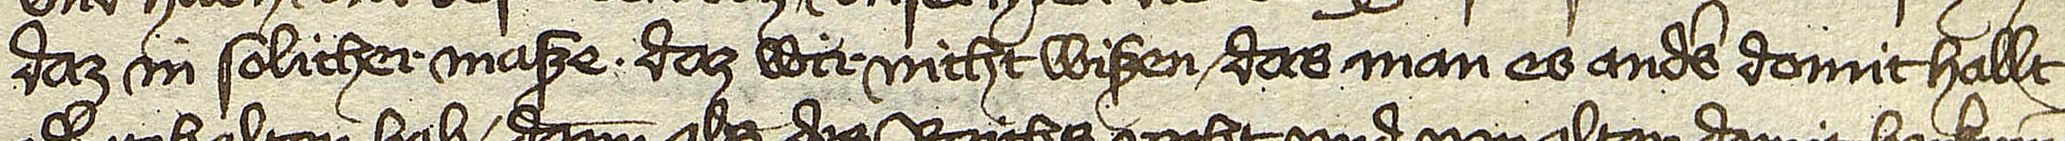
daʒ in ſolicher maſʒe . daʒ wir nicht wiſʒen / das man es ands* domit hallt
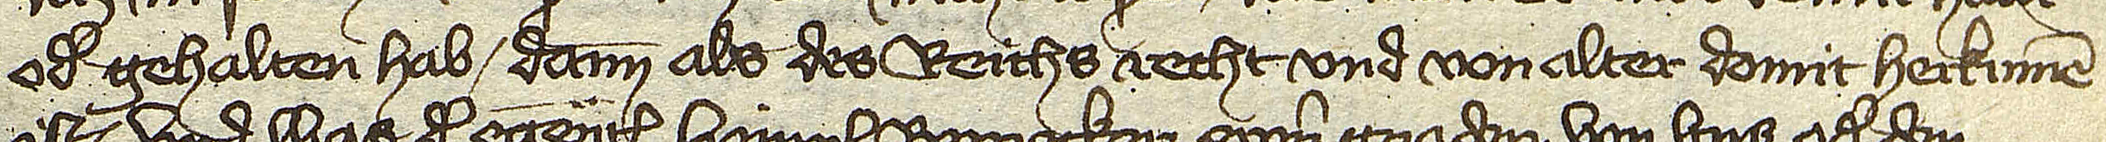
od* gehalten hab / dann als des Reichs recht vnd von alter domit herkume*
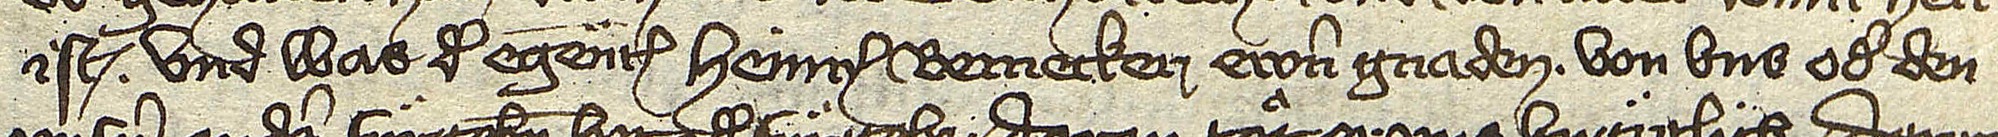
iſt / . vnd was d* egent* Heinr* Bernecker ewn* gnaden . von vns od* den
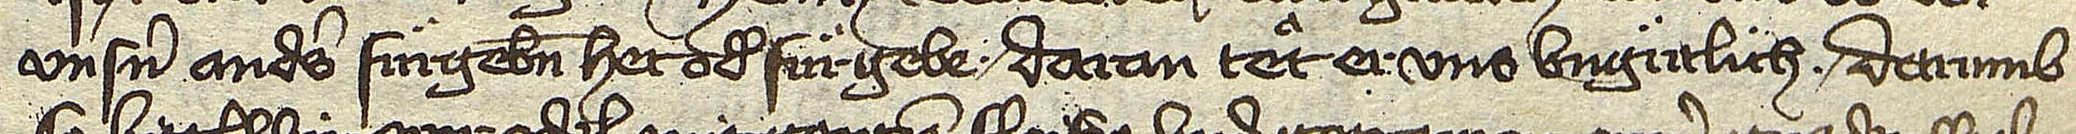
vnſn* ands* fürgebn* her od* fürgebe / daran tët er vns vngütlich . / Darumb
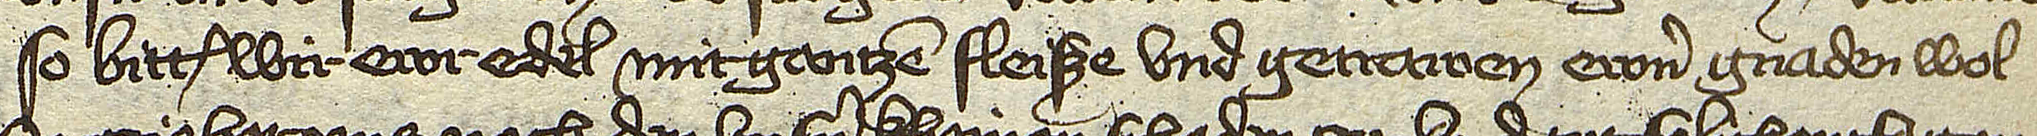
ſo bitt* wir ewr edel mit gancʒe* fleiſʒe vnd getrawen ewn* gnaden wol
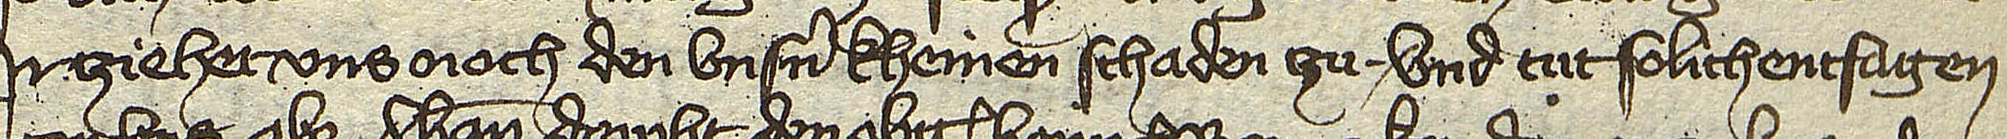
Ir cʒiehet vns noch den vnſn* kheinen ſchaden cʒu . / vnd tut ſolich entſagen
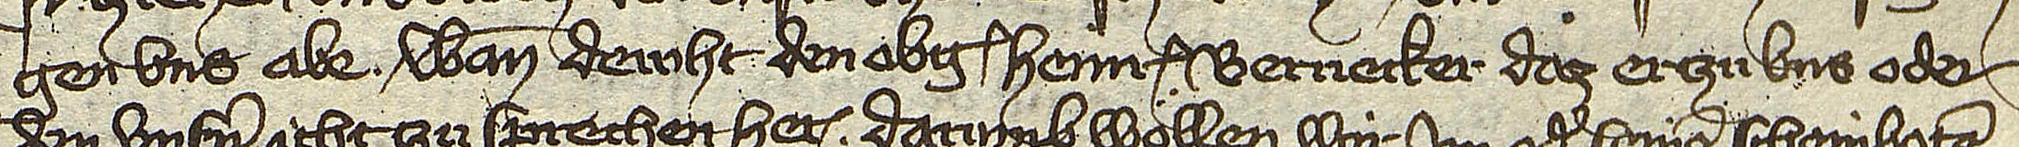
gen vns abe . / wan* dewht den obg* heinr* Bernecker daʒ er cʒu vns oder
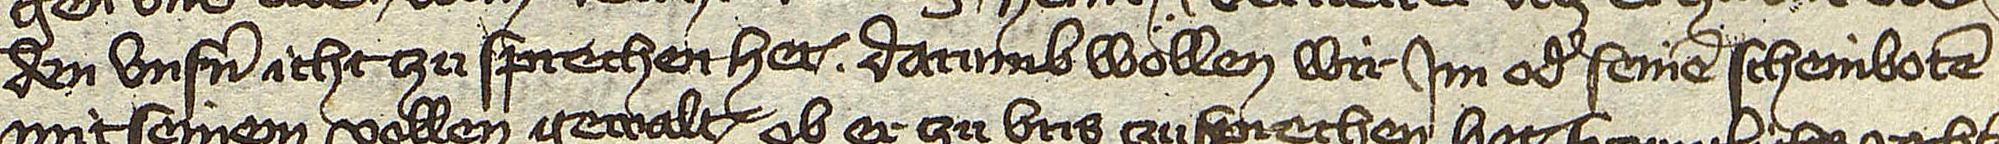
den vnſn* icht cʒu ſprechen het / . darumb wöllen wir Im od* ſeine* ſcheinbote*
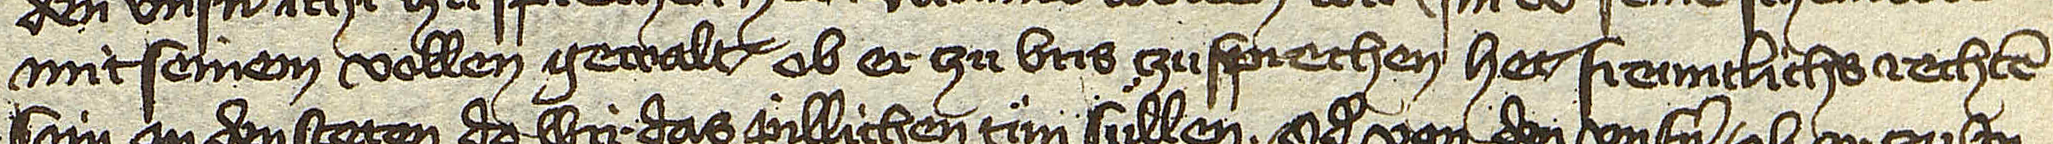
mit ſeinen vollen gewalt / ob er an vns cʒuſprechen het / freuntlichs rechte*
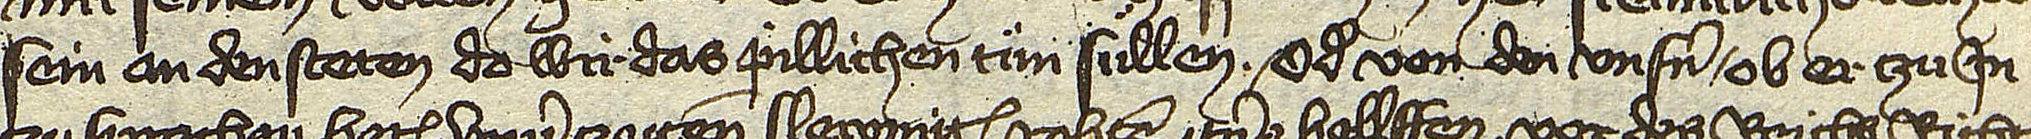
ſein an den ſteten do wir das pillichen tün ſüllen . / Od* von den vnſn* / ob er cʒu In
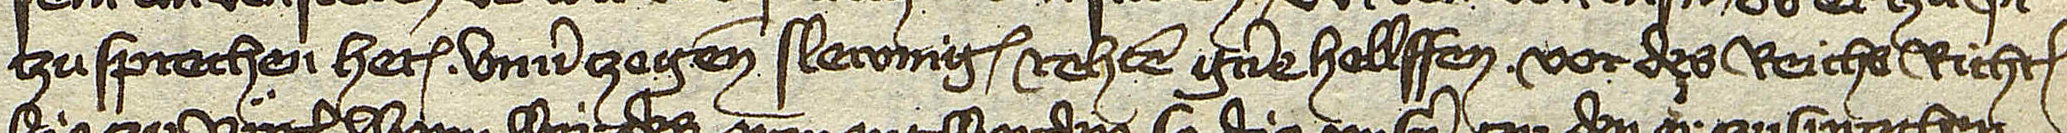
cʒu ſprechen het / . vnu*cʒogen* ſlewnig* rehte* gn*e helffen vor des Reichs Richt*
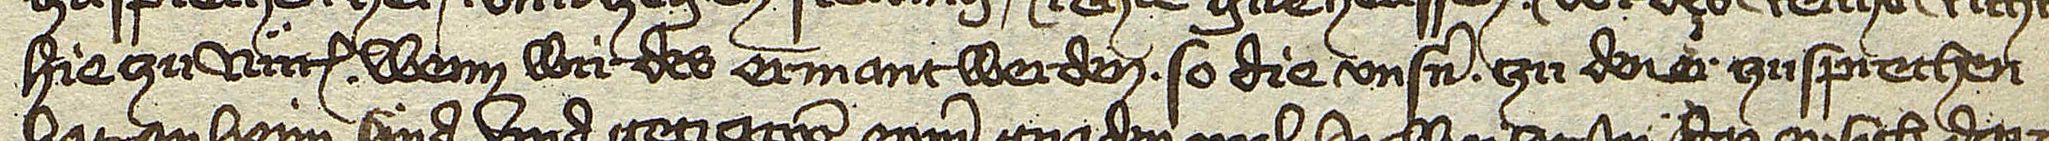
hie cʒu Nür* . wenn wir des ermant werden . ſo die vnſn* . cʒu den er cʒuſprechen
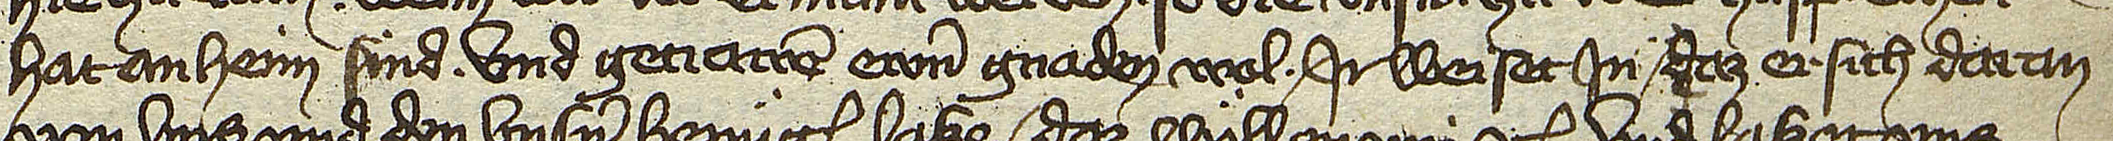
hat anheim ſind . vnd getrawe* ewn* gnaden wol . / Ir weiſet In / daʒ er ſich daran
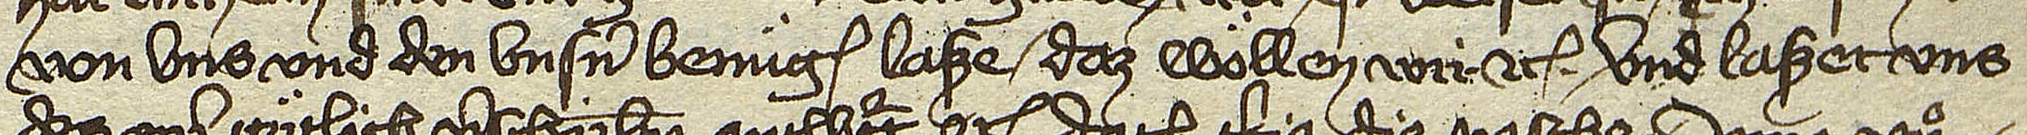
von vns vnd den vnſn* benüg* laſʒe* / daʒ wöllen wir ec* . / Vnd laſʒet vns
